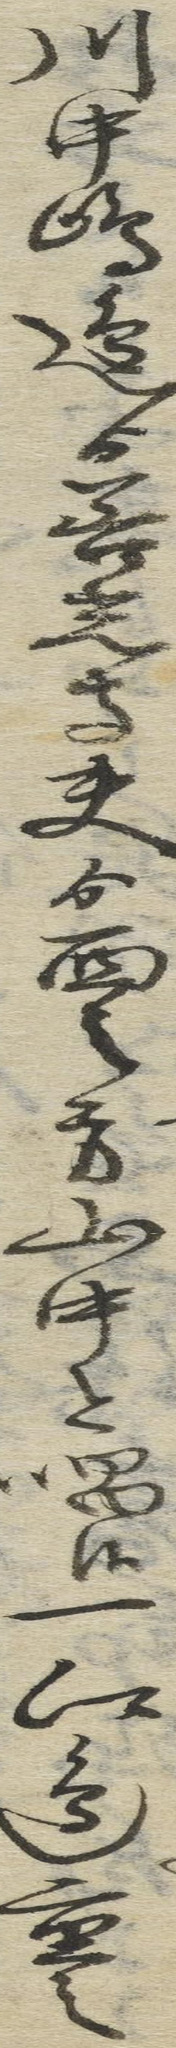川中嶋辺ゟ善光寺夫ゟ西之方山中と唱候一郷之辺重之
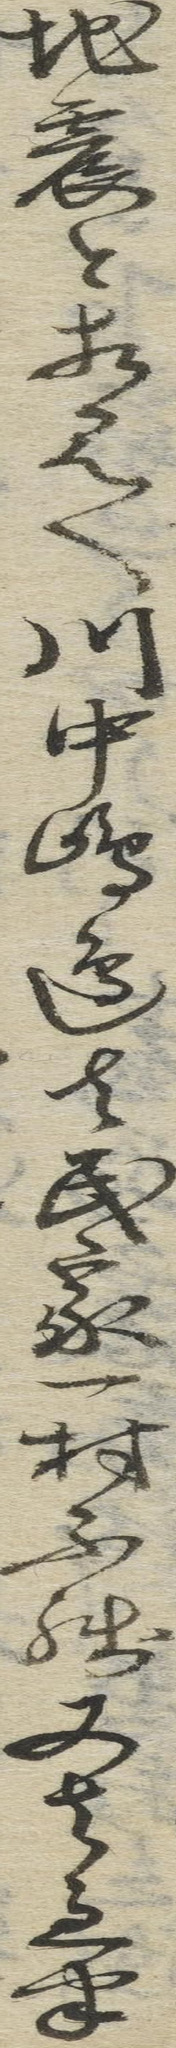地震と相見へ川中嶋辺ハ民家一村不残又は過半
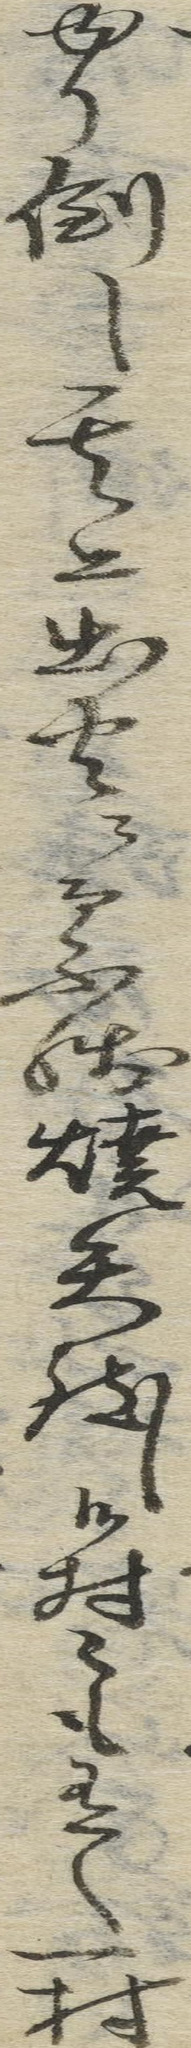ゆり倒し其上出火二而不残焼失致し候村々も有之一村
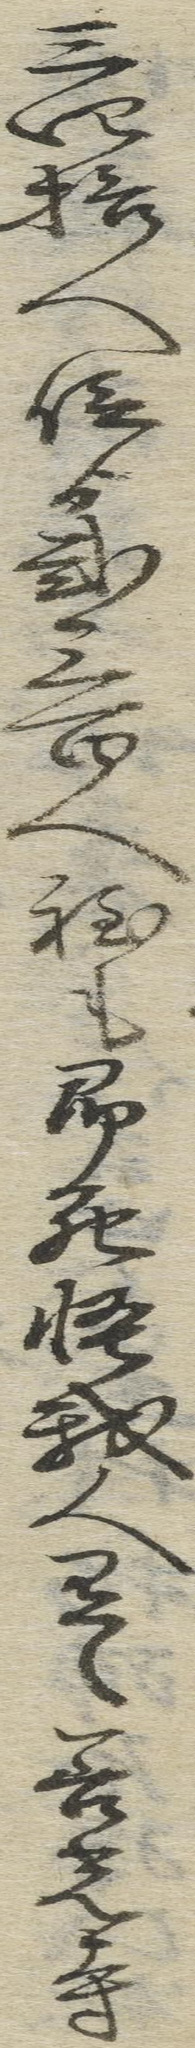三四拾人位ゟ弐三百人程も即死怪我人有之善光寺
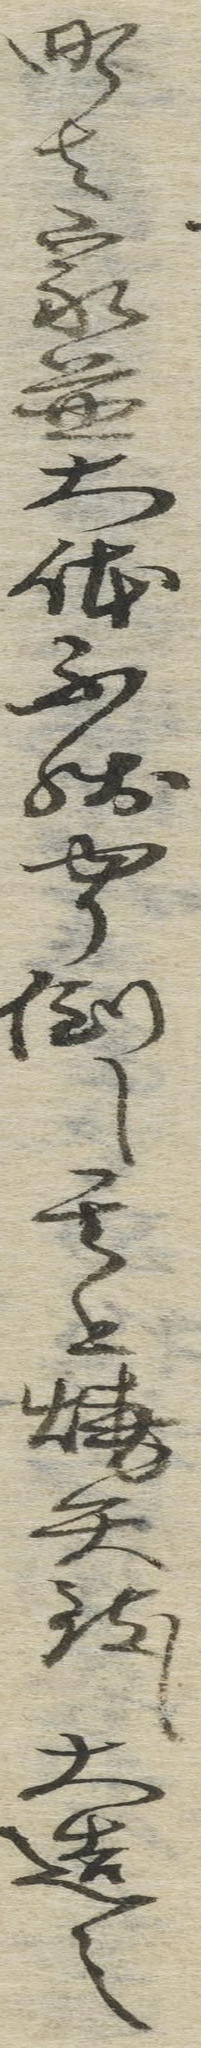町は家並大体不残ゆり倒し其上焼失致し大造之
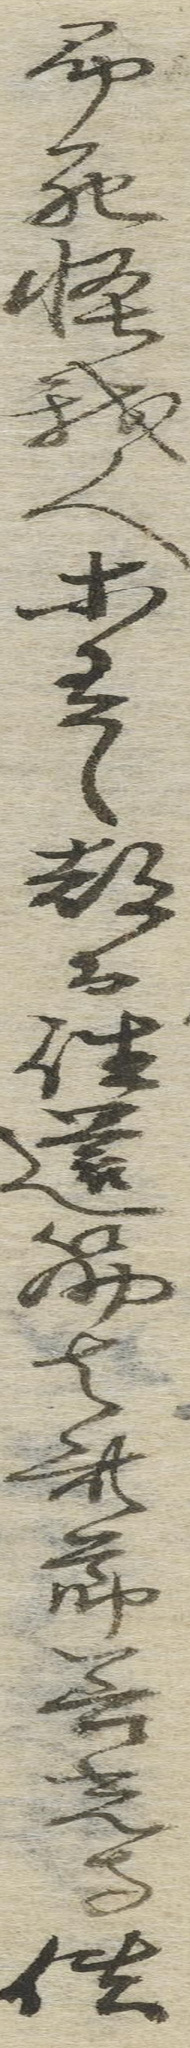即死怪我人等有之都而往還筋は此節善光寺供
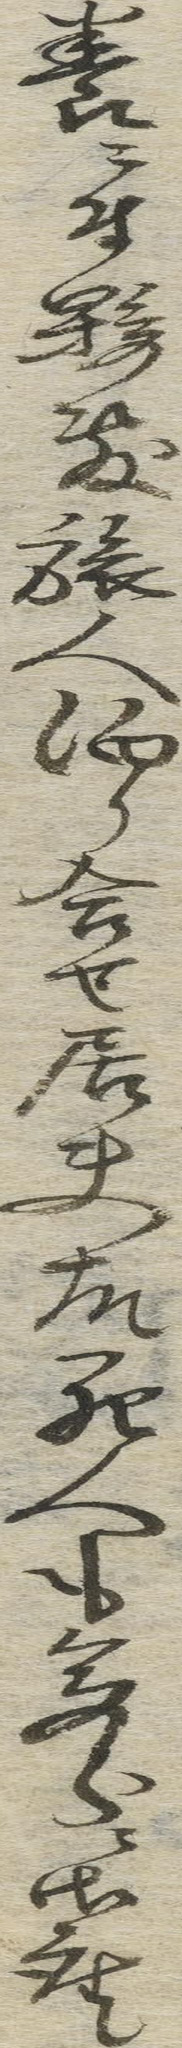養ニ付夥敷旅人泊り合セ居夫故死人も多分に御座候
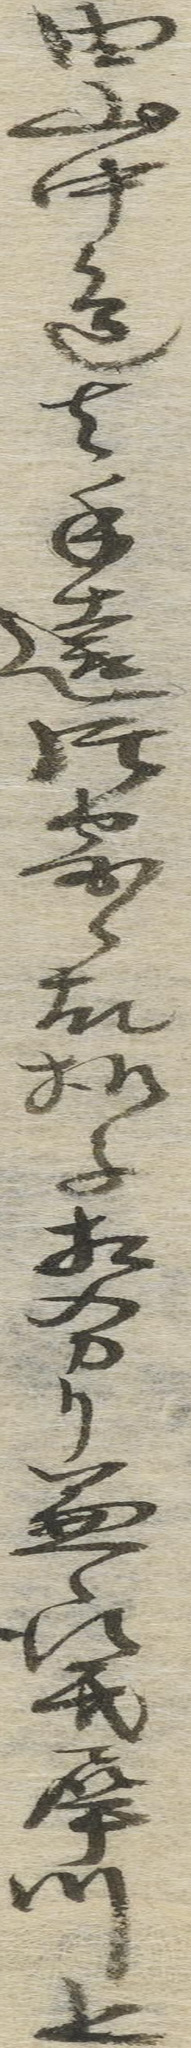由山中辺は手遠片寄候故様子相分り兼候得共犀川上
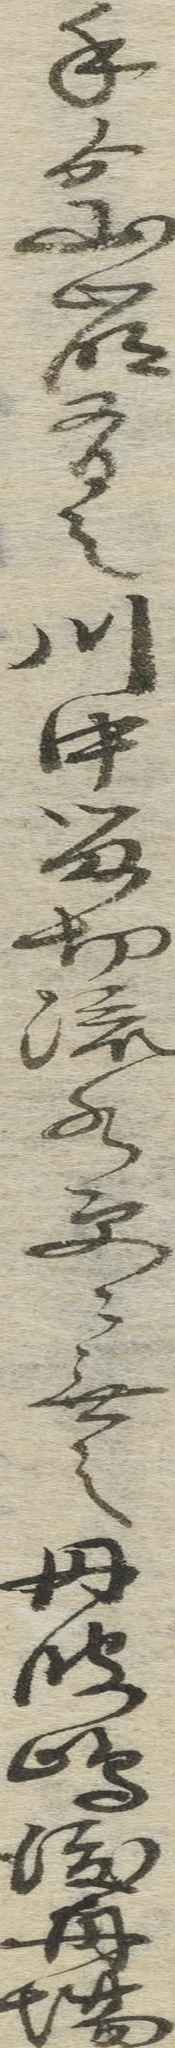手ゟ山崩有之川中留切流水更々無之丹波嶋渡舟場
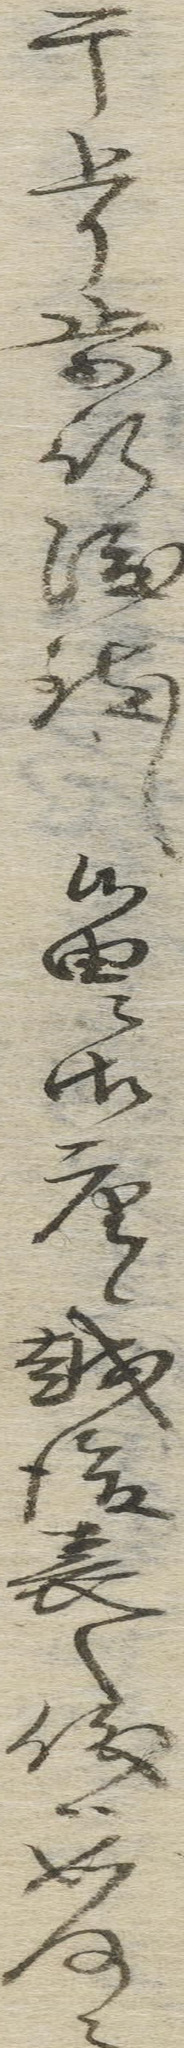干上り歩行渡致し候由二御座候越後表之儀ハ如何二
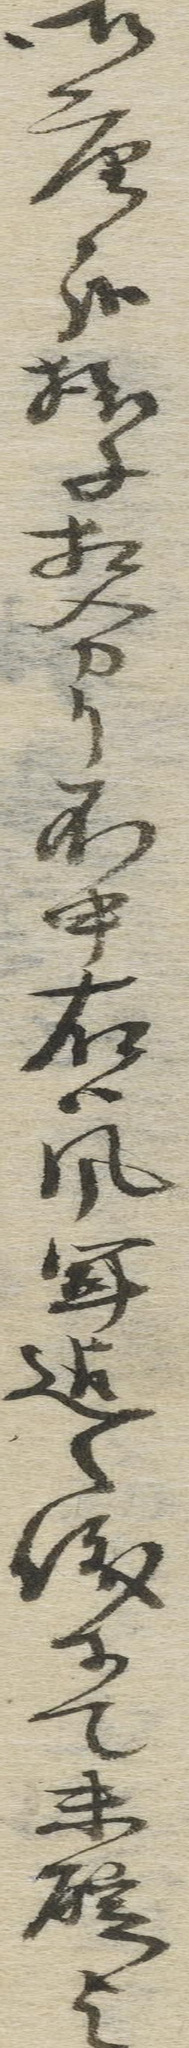御座候哉様子相分り不申右ハ風聞迄之儀にて未聢と
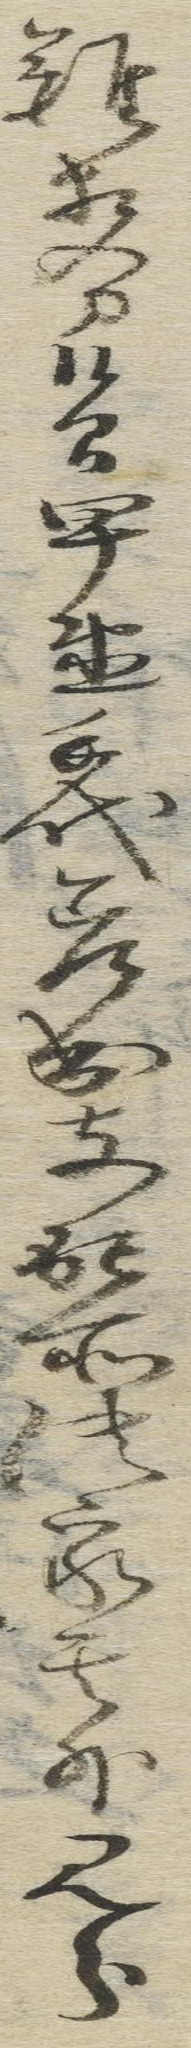難相分候間早速手代差出支配所潰家其外見分
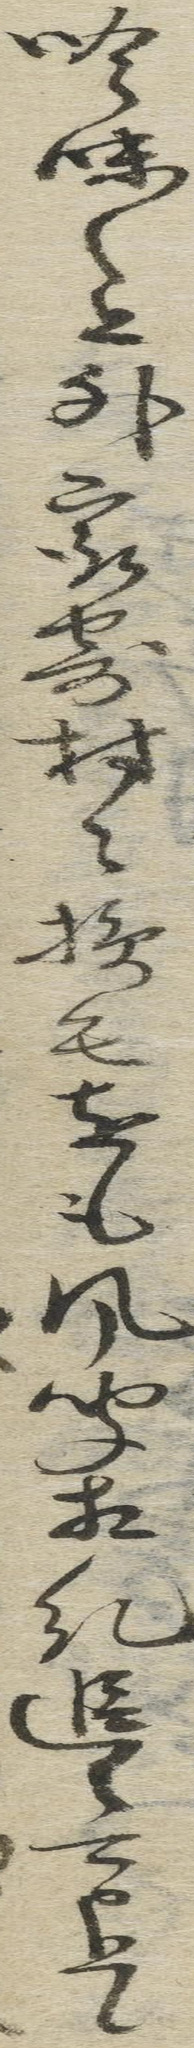吟味之上外最寄村々損亡をも風聞等相糺し追々可申上候
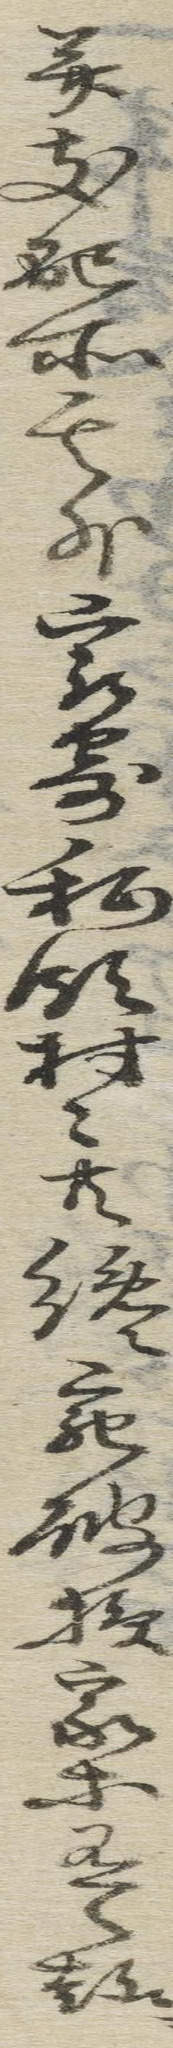并支配所其外最寄私領村々共纔宛之破損家等有之趣二
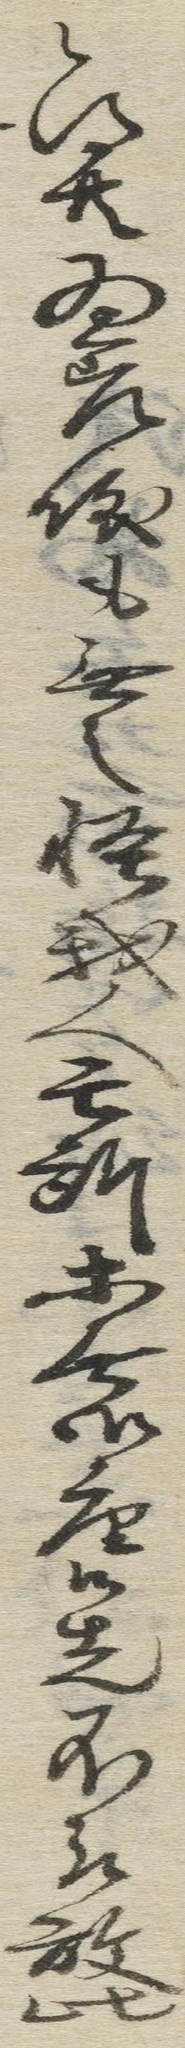候得共為差儀も無之怪我人亡所等無御座候先
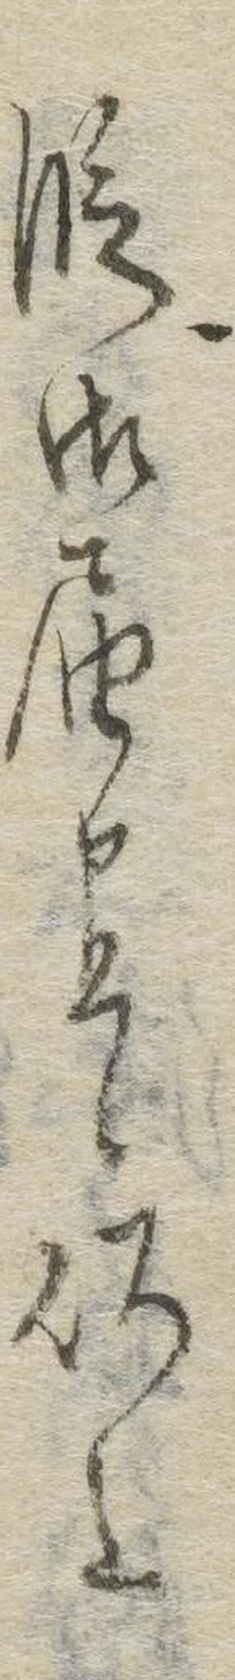段御届申上候以上
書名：信濃越後　地震書留
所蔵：東京大学地震研究所図書室 Earthquake Research Institute Library, The University of Tokyo, JAPAN
